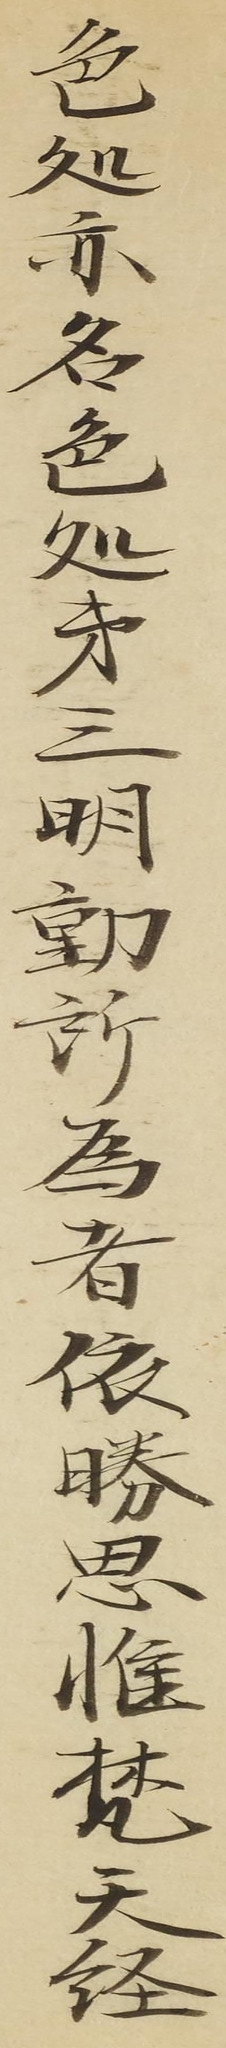色処亦名色処第三明動所為者依勝思惟梵天経
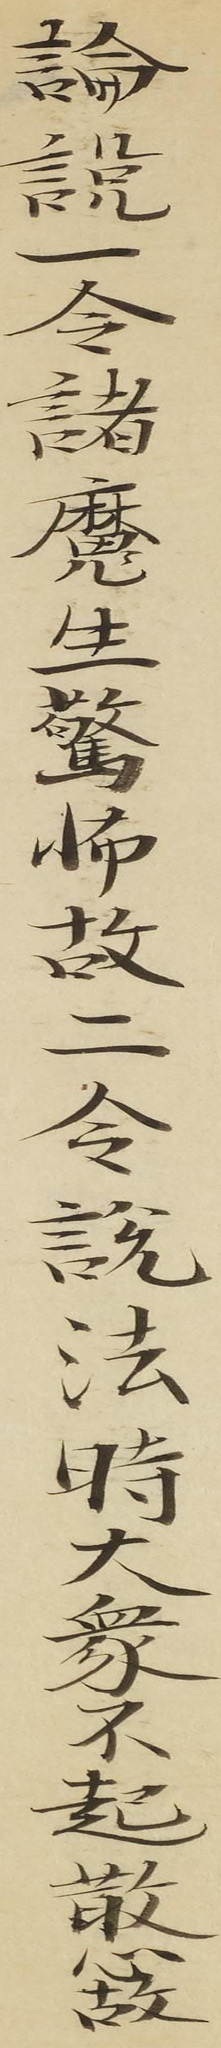論説一令諸魔生驚怖故ニ令説法時大衆不起散心故
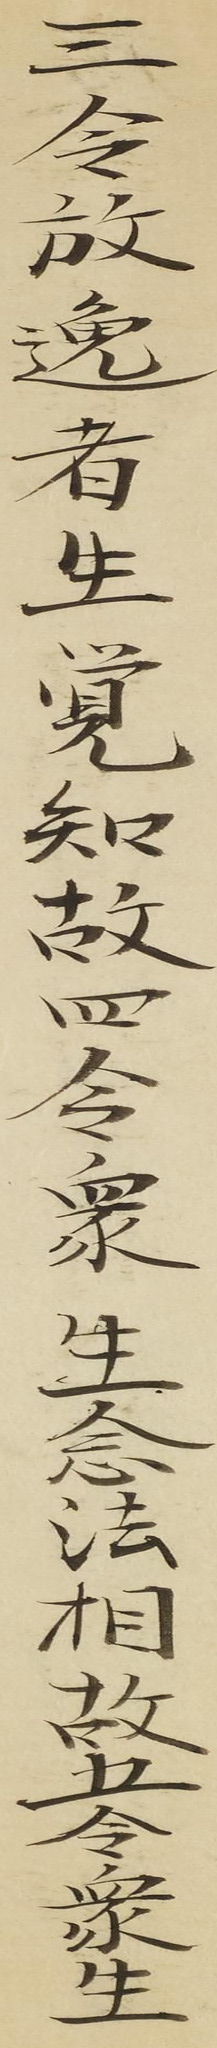三令放逸者生覚知故四令衆生念法相故五令衆生
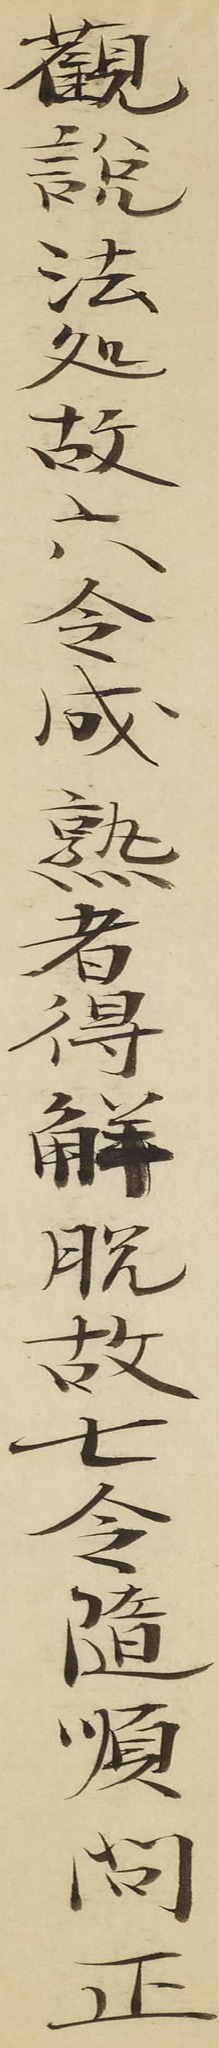観説法処故六令成熟者得解脱故七令随順問正
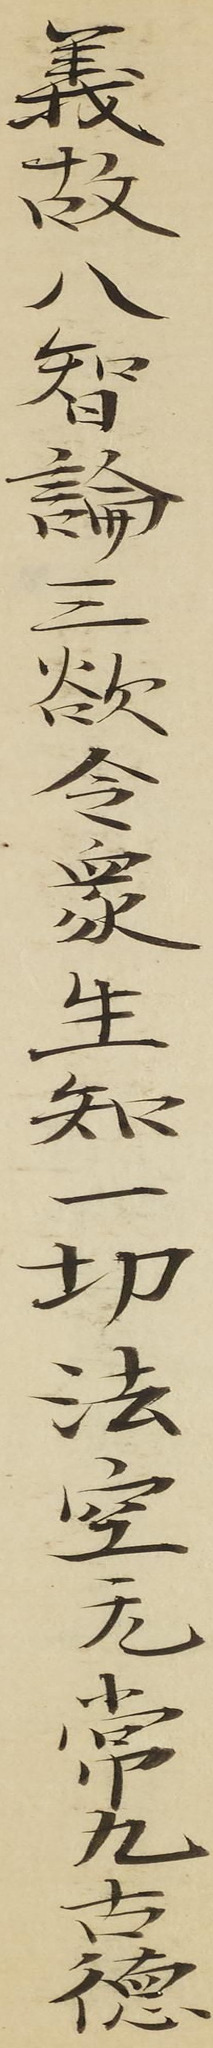義故八智論三欲令衆生知一切法空无常九古徳
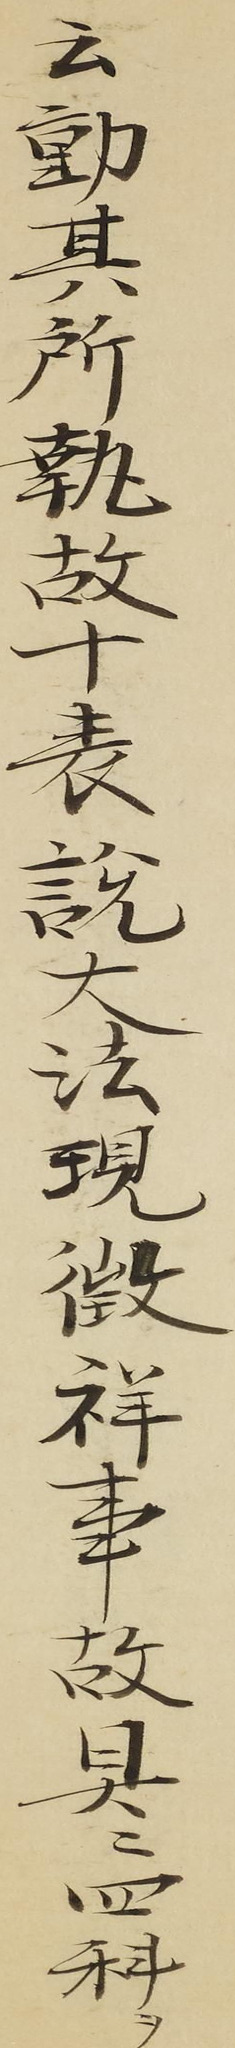云動其所執故十表説大法現徴祥事故具ニ四科ヲ
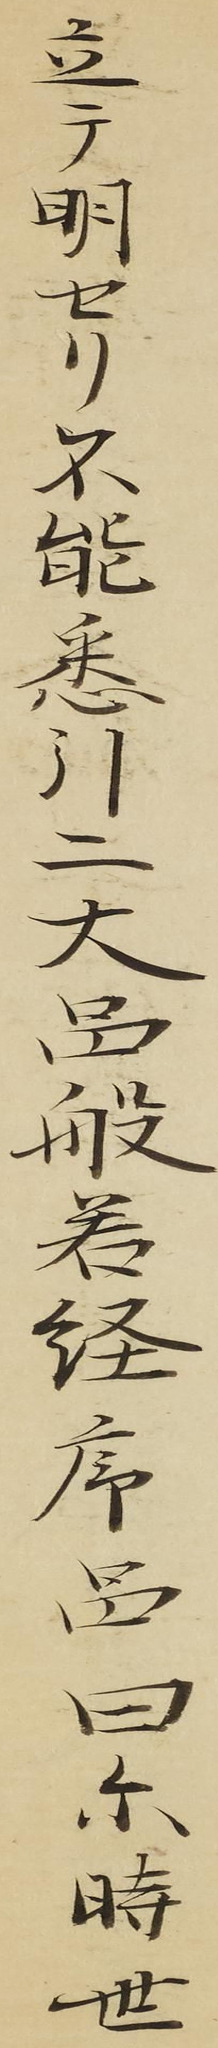立テ明セリ不能悉引ニ大品般若経序品曰尓時世
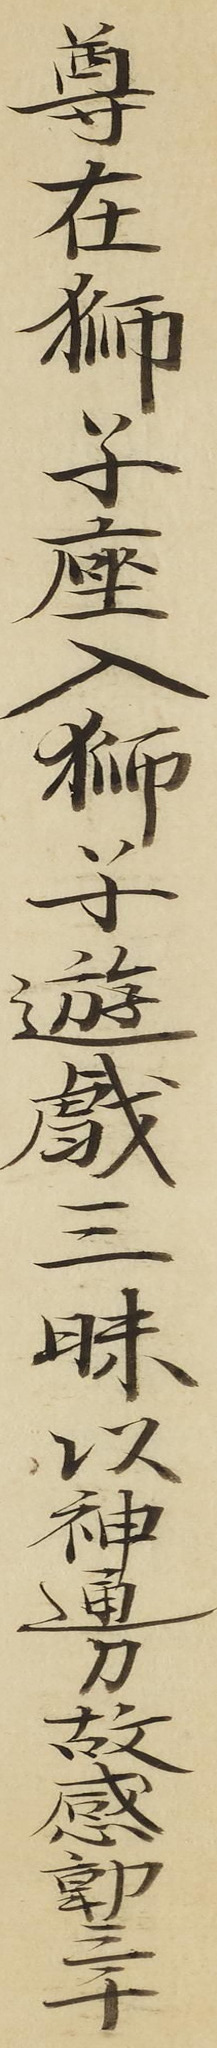尊在獅子座入獅子遊戯三昧以神通力故感動三千
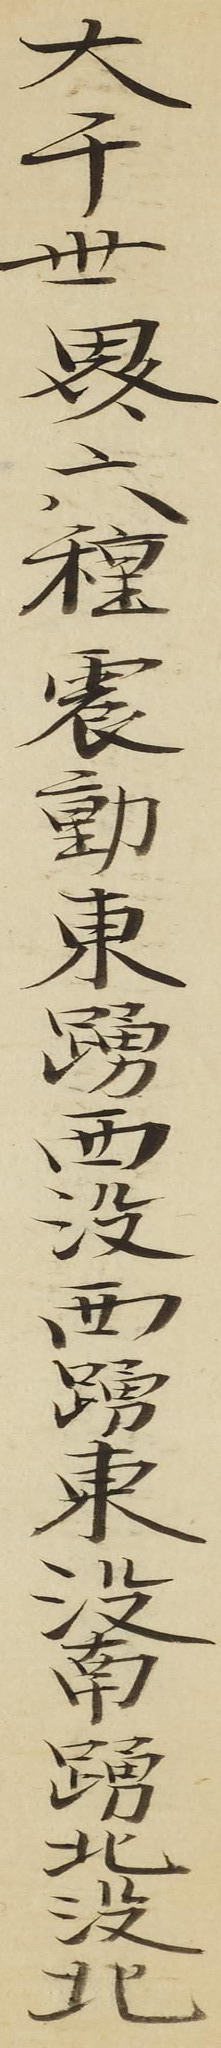大千世界六種震動東踴西没西踴東没南踴北没北
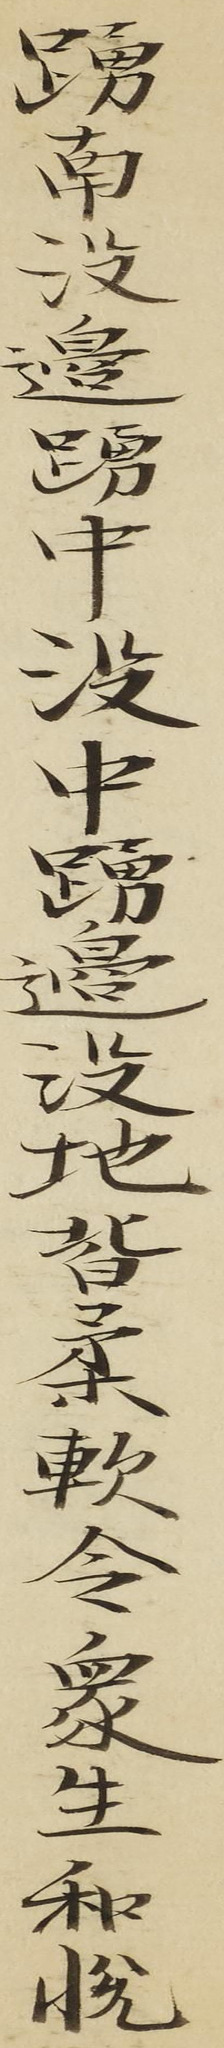踴南没辺踴中没中踴辺没地皆柔軟令衆生和悦
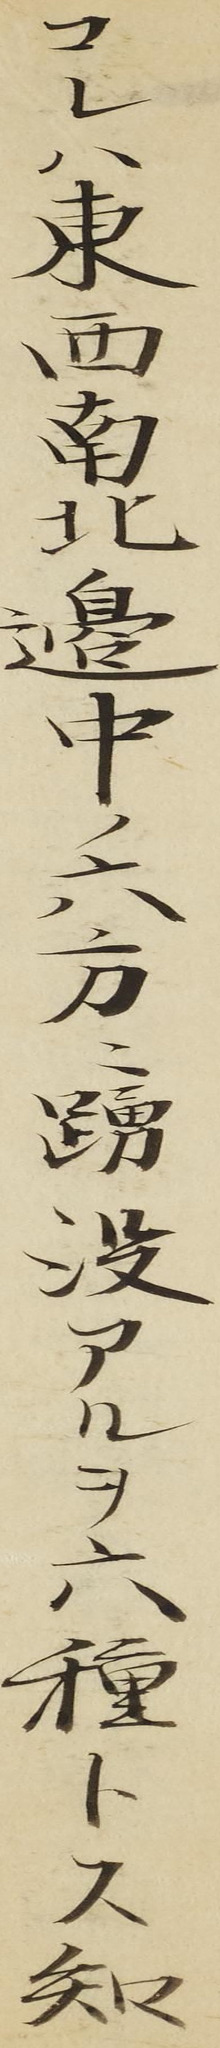コレハ東西南北辺中ノ六方ニ踴没アルヲ六種トス知
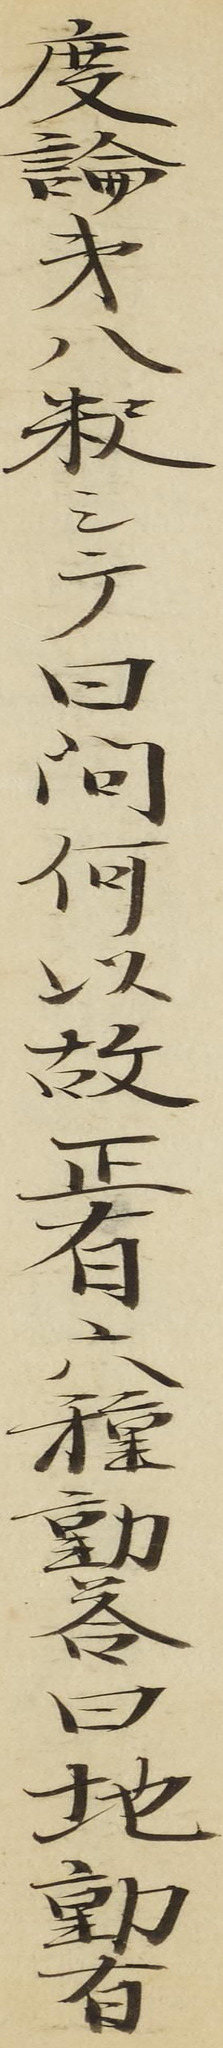度論第八釈シテ曰問何以故正有六種動答曰地動有
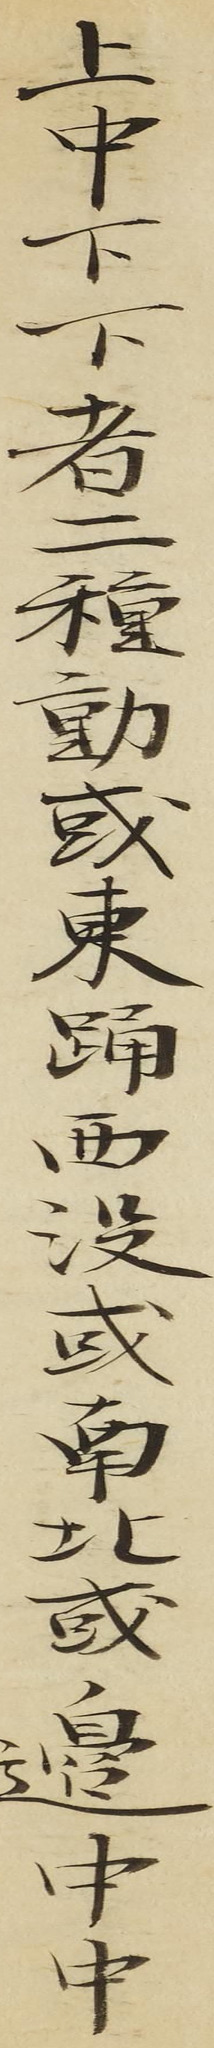上中下下者ニ種動或東踊西没或南北或辺中中
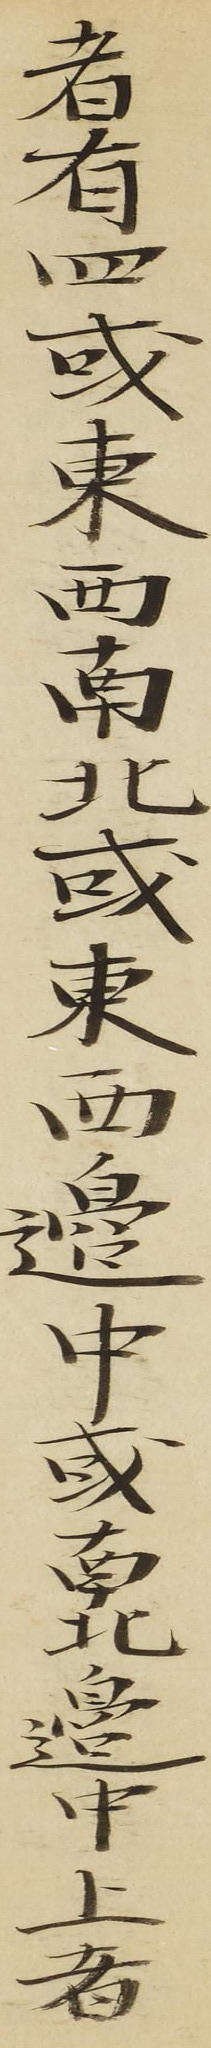者有四或東西南北或東西辺中或南北辺中上者
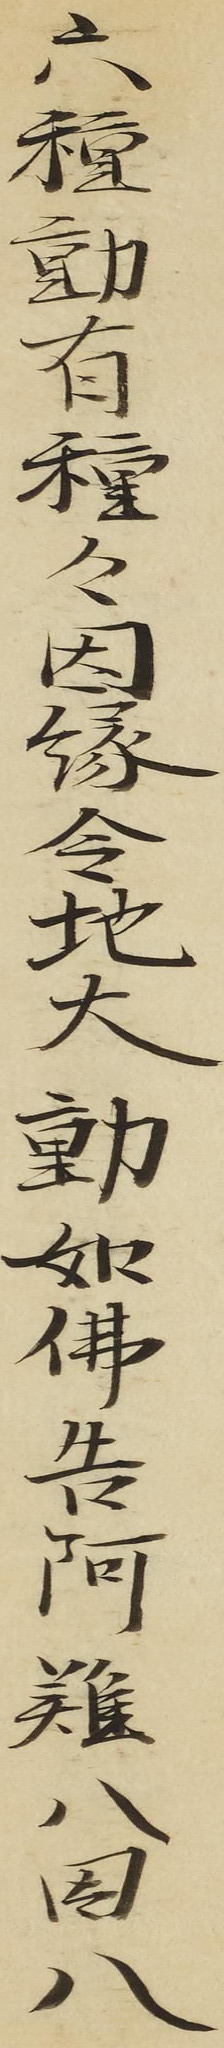六種動有種々因縁令地大動如仏告阿難八因八
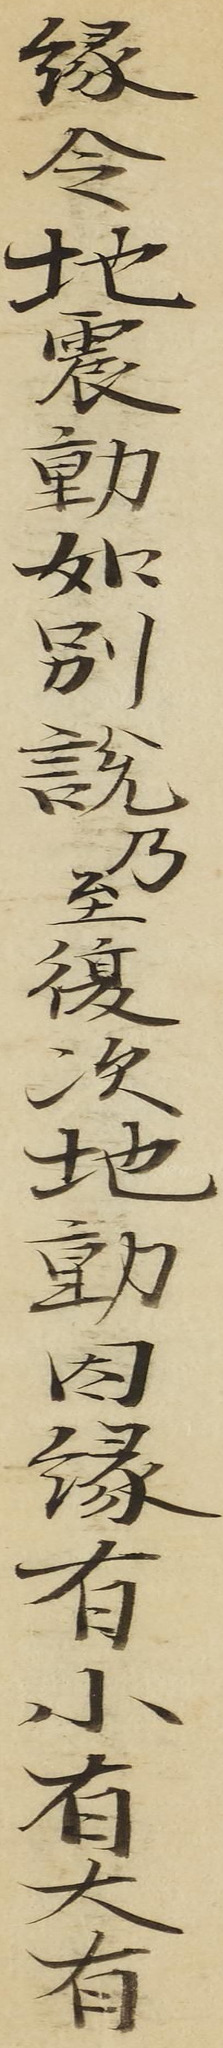縁令地震動如別説乃至復次地動因縁有小有大有
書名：地震説　鶴高山善仁寺天柗老人著述　全
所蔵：東京大学地震研究所図書室 Earthquake Research Institute Library, The University of Tokyo, JAPAN
